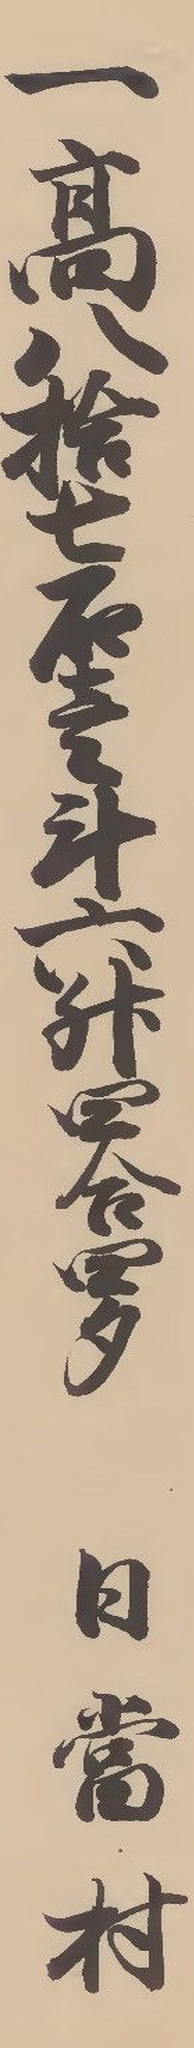一高八拾七石壱斗六升四合四勺日当村
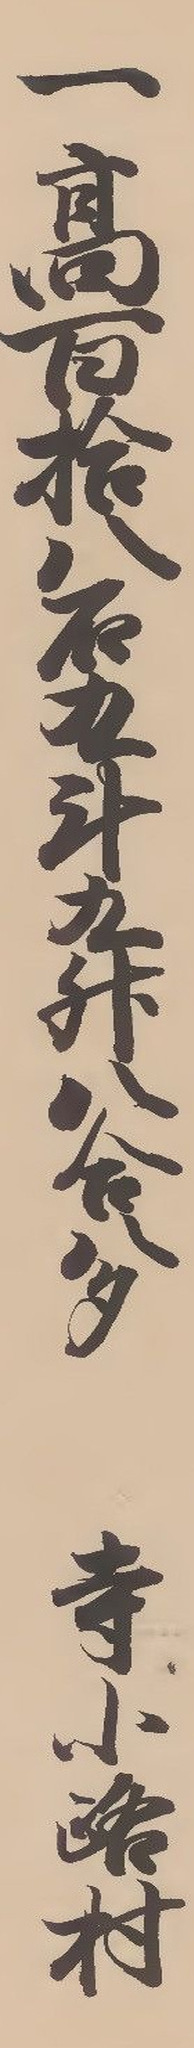一高百拾八石九斗九升八合八勺寺小路村
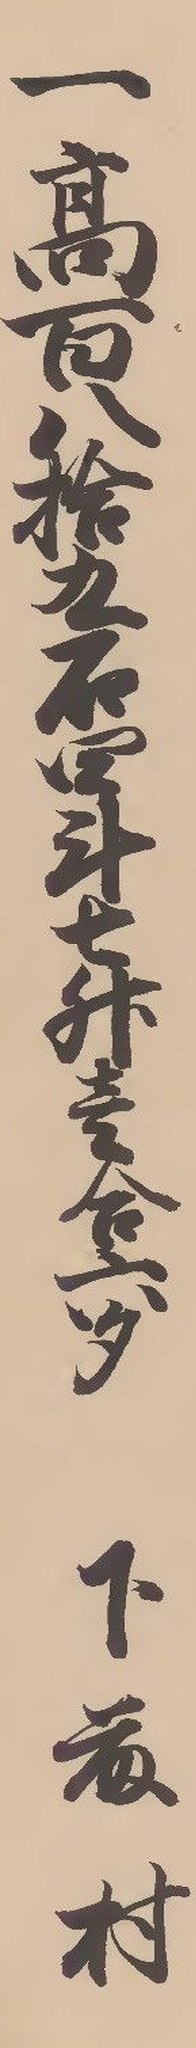一高百八拾九石四斗七升壱合六勺下藤村

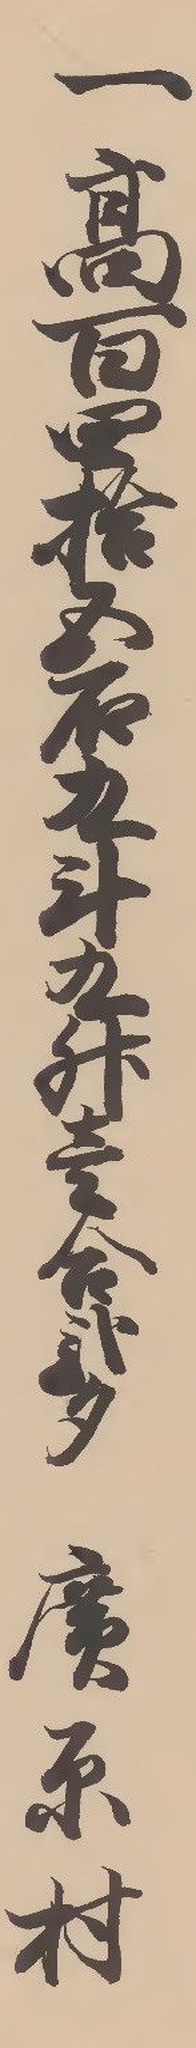一高百四拾五石九斗九升壱合弐勺広原村
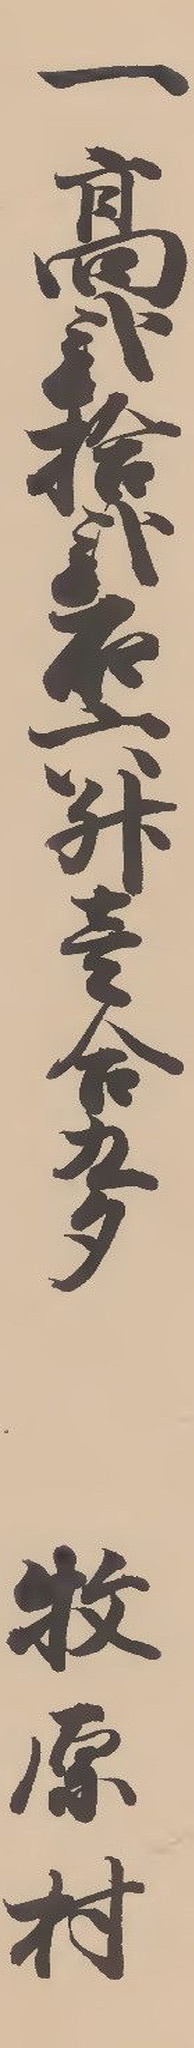一高弐拾弐石六升壱合九勺牧原村
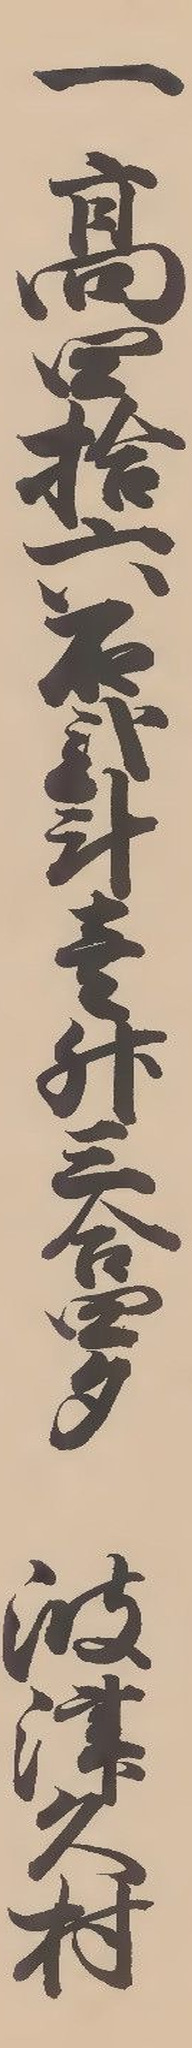一高四拾六石弐斗壱升三合四勺波津久村
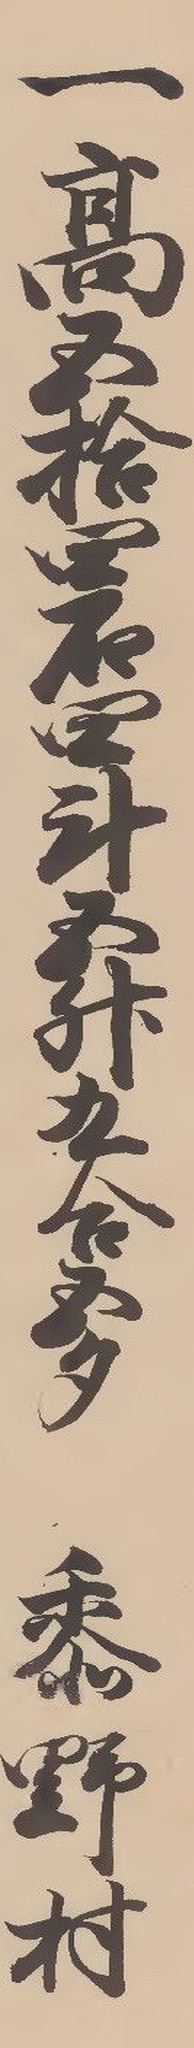一高五拾四石四斗五升九合五勺黍野村
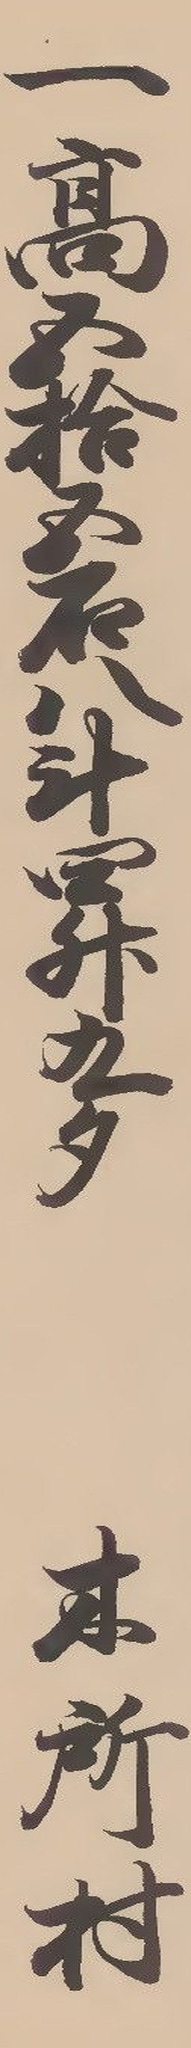一高五拾五石八斗四升九勺木所村
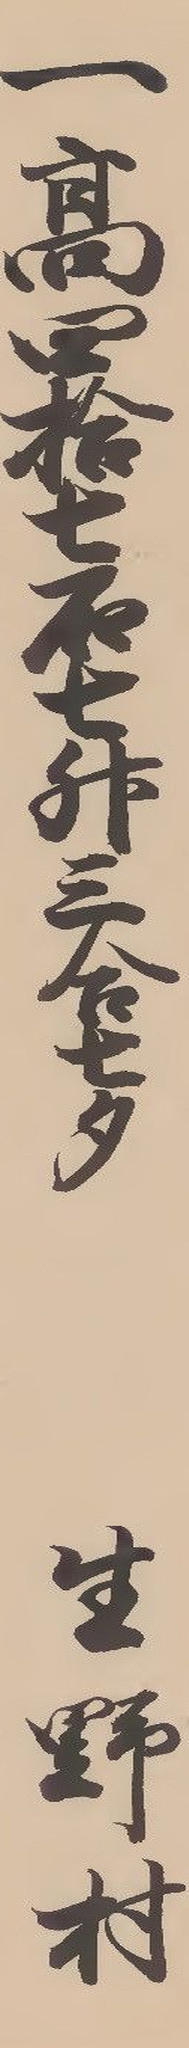一高四拾七石七升三合七勺生野村
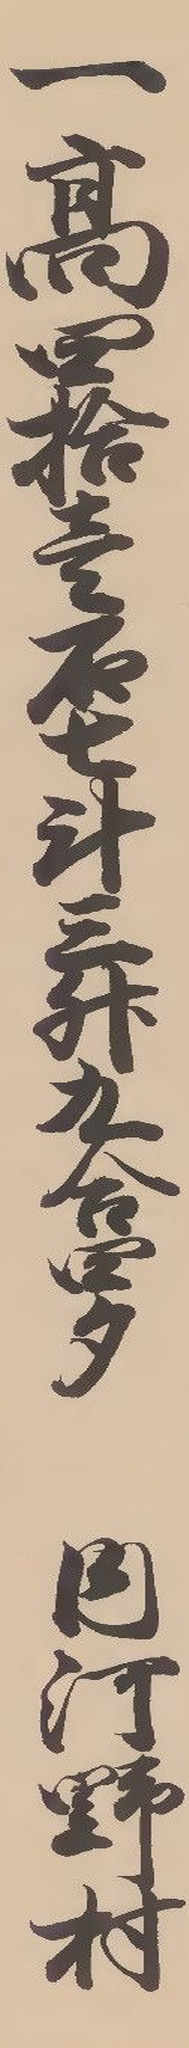一高四拾壱石七斗三升九合四勺内河野村
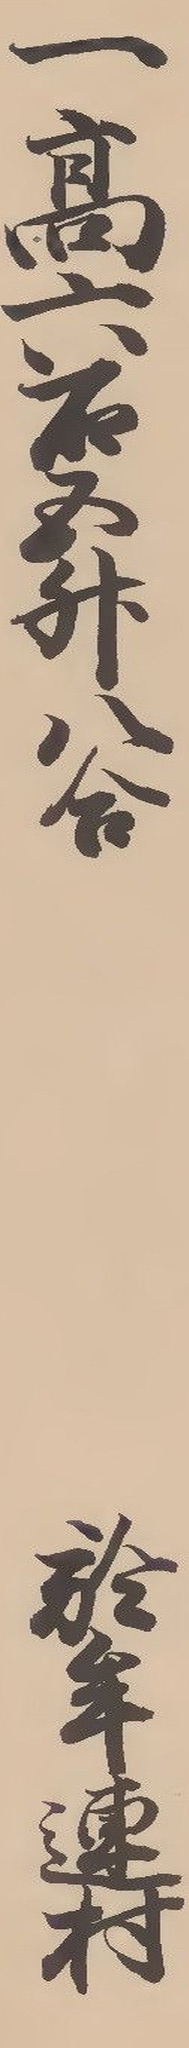一高六石五升八合於牟連村

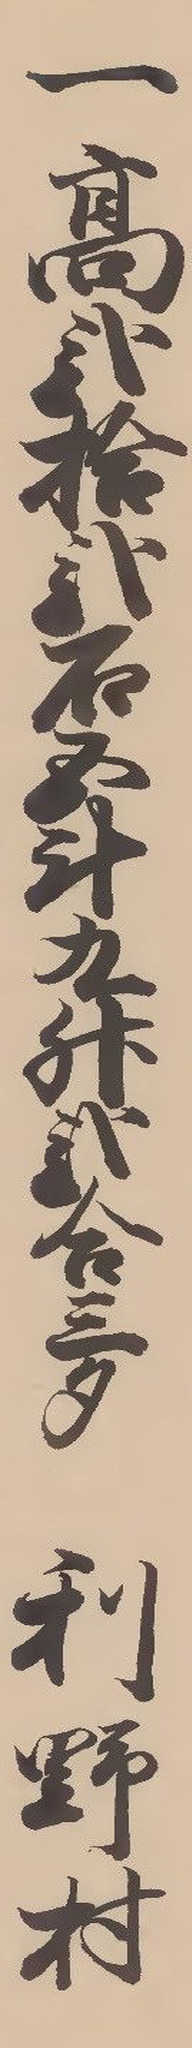一高弐拾弐石五斗九升弐合三勺利野村
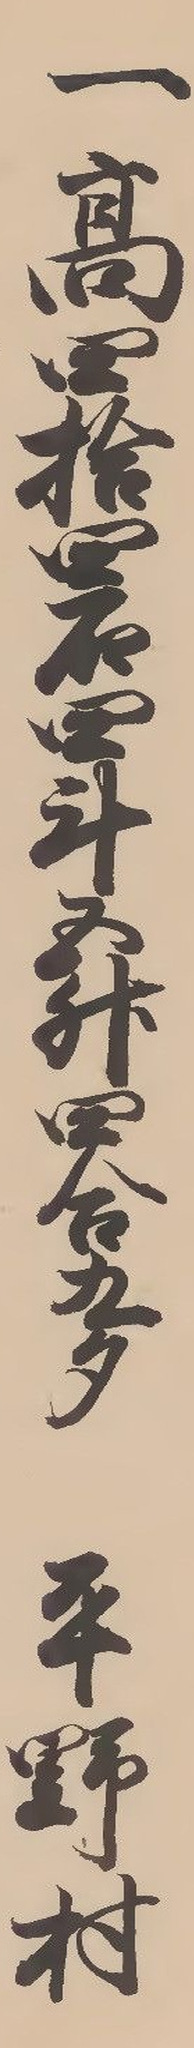一高四拾四石四斗五升四合九勺平野村
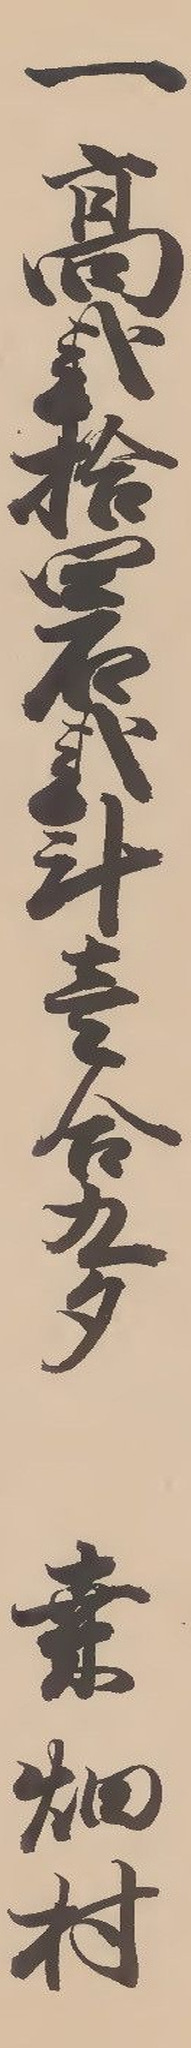一高弐拾四石弐斗壱合九勺桑畑村
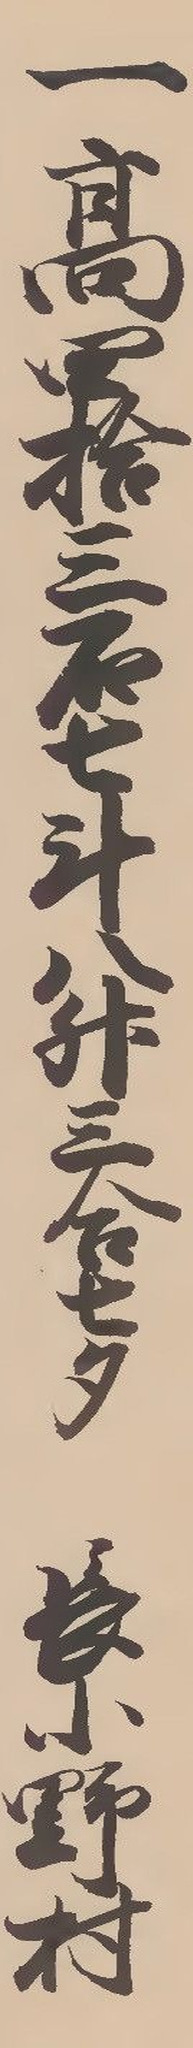一高四拾三石七斗八升三合七勺長小野村
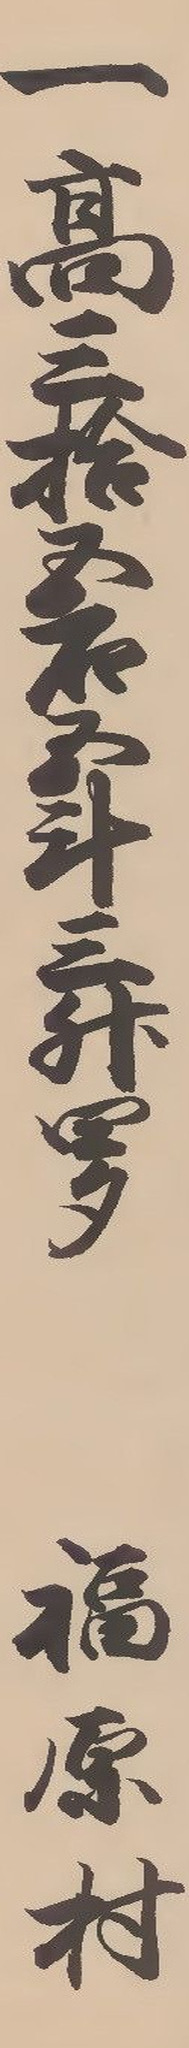一高三拾五石五斗三升四勺福原村
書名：豊後国郷帳
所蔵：国立公文書館 National Archives of Japan
